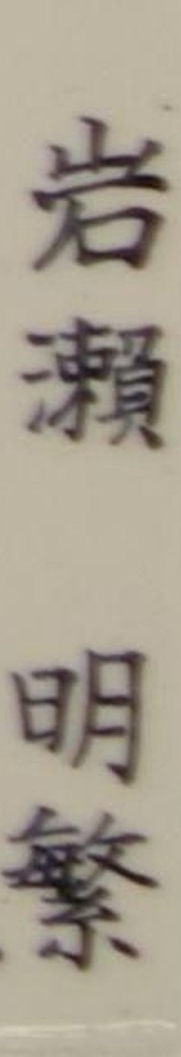岩瀬明繁
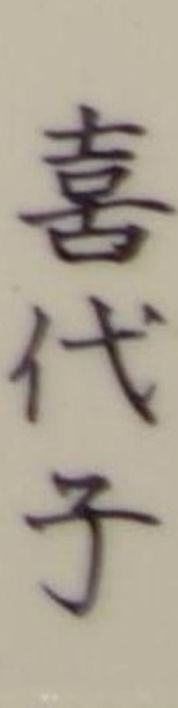喜代子
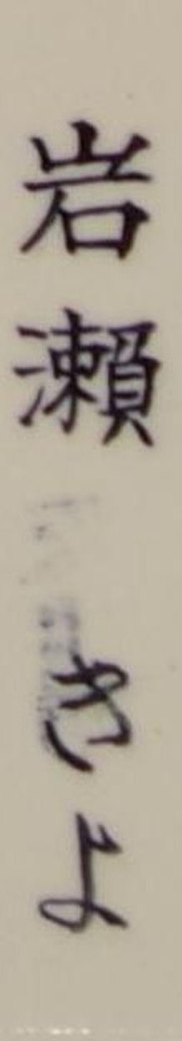岩瀬きよ
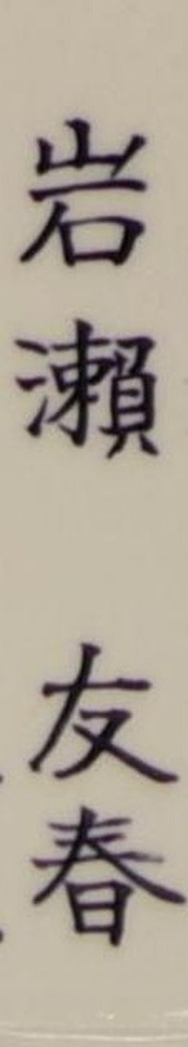岩瀬友春

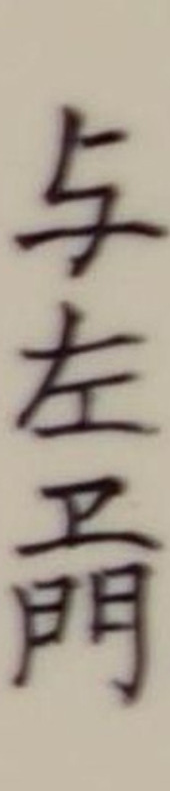与左ヱ門
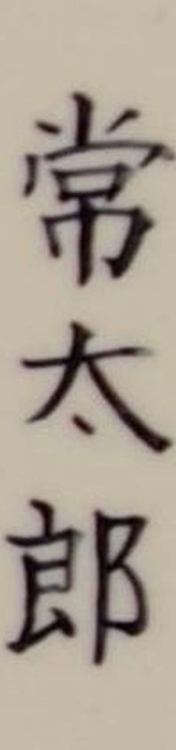常太郎
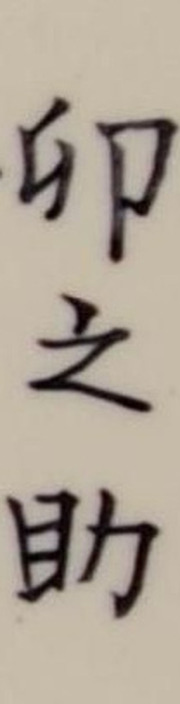卯之助
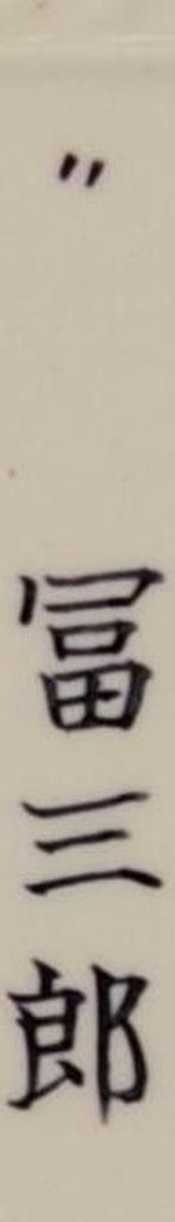冨三郎
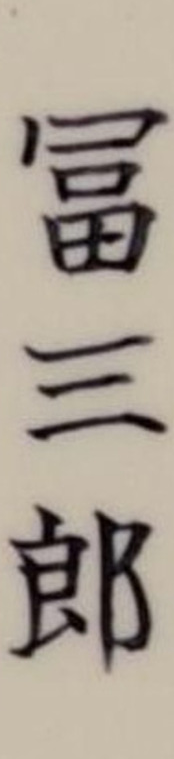冨三郎
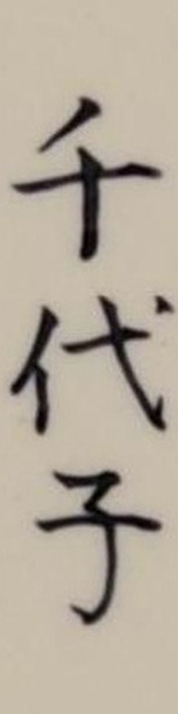千代子
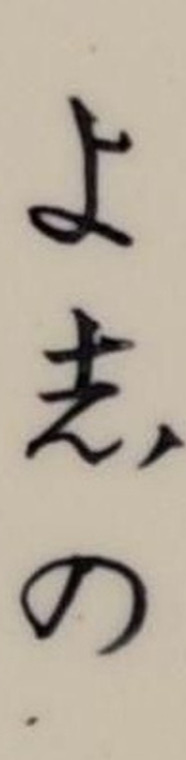よしの
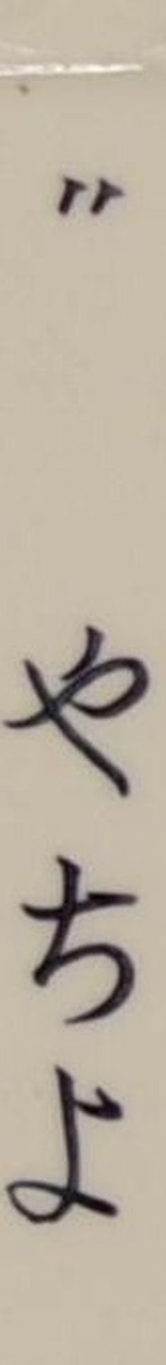やちよ
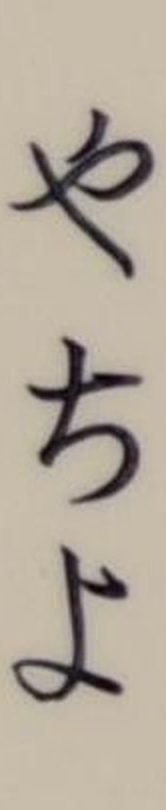やちよ
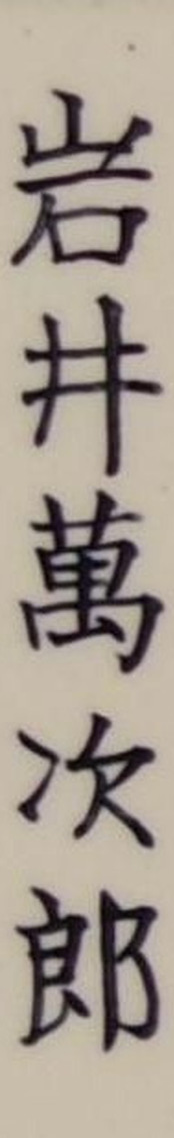岩井萬次郎
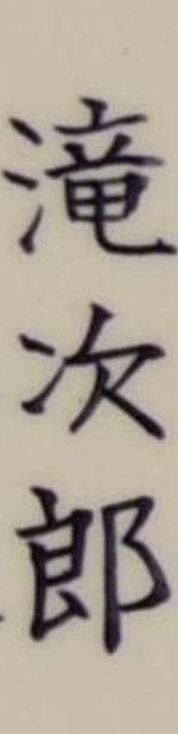滝次郎

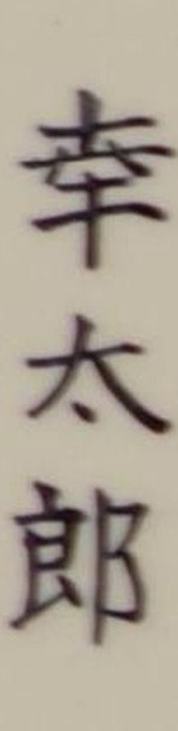幸太郎
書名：M~S
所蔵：高野山金剛峯寺
